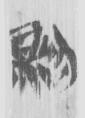則
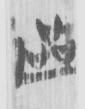區
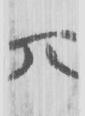亓
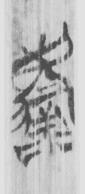{鹿录}
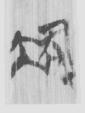{大豕}
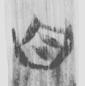自
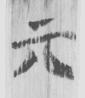亓
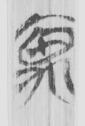寓
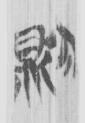則
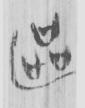區
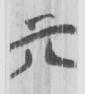亓
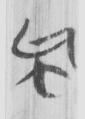虯
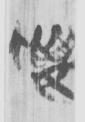螻
